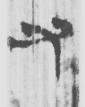又
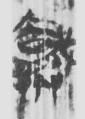{暴戈}
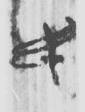民
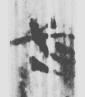必
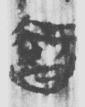智
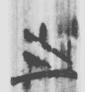之
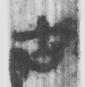古
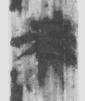天
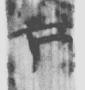下
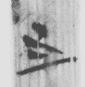之
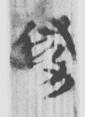{臣又力}
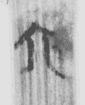六
